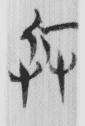兵
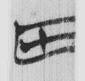甲
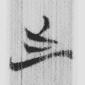之
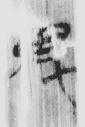鬼
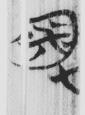{釆斗}
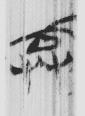弃
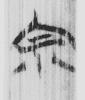宗
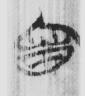{宀苗}
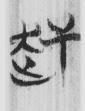赶
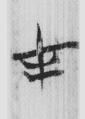才
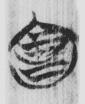會
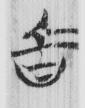旨
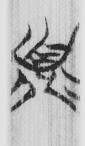寡
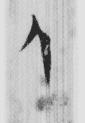人
